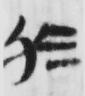於
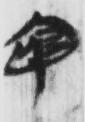竆（躬）
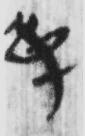身
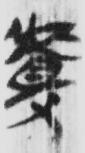○（且）
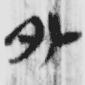外
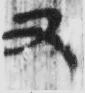又（有）
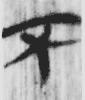不
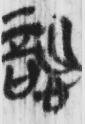○（順）
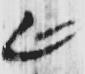㠯（以）
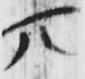亓（其）
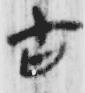古（故）
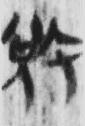敓
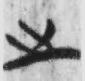之
